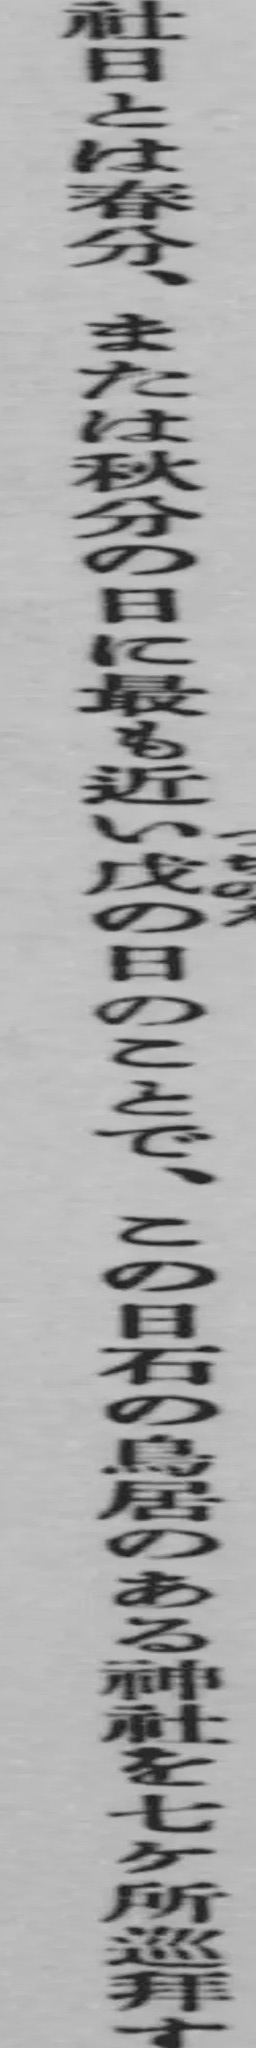社日とは春分、または秋分の日に最も近い戊の日のことで、この日石の鳥居のある神社を七ヶ所巡拜す
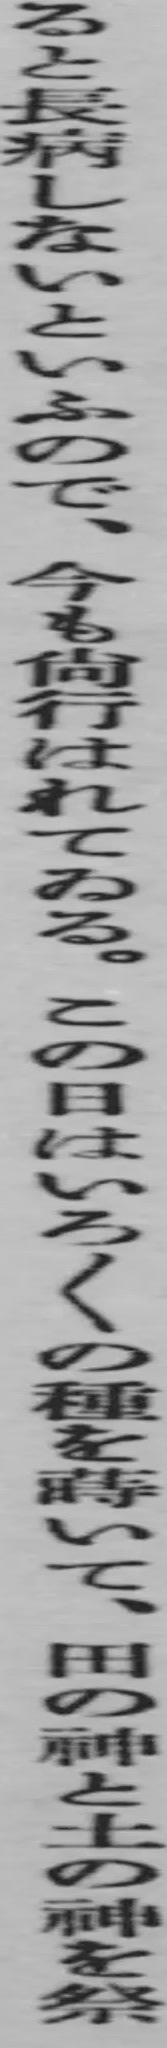ると長病しないといふので、今も尚行はれてゐる。この日はいろ〳〵の種を蒔いて、田の神と土の神を祭
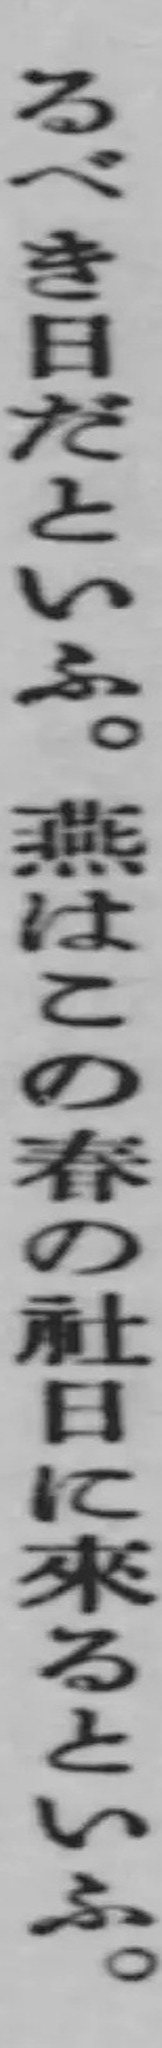るべき日だといふ。燕はこの春の社日に來るといふ。
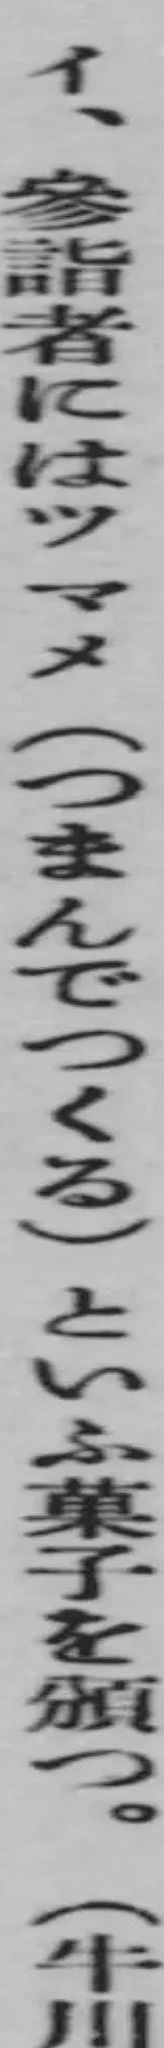イ、參詣者にはツマメ(つまんでつくる)といふ菓子を頒つ。(牛川)
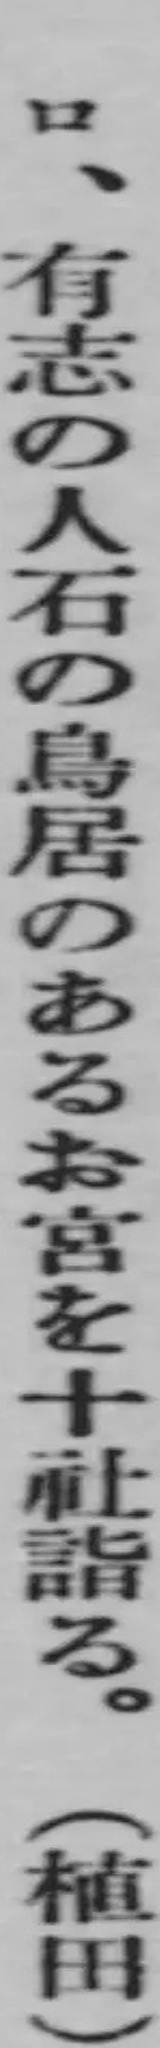ロ、有志の人石の鳥居のあるお宮を十社詣る。(植田)
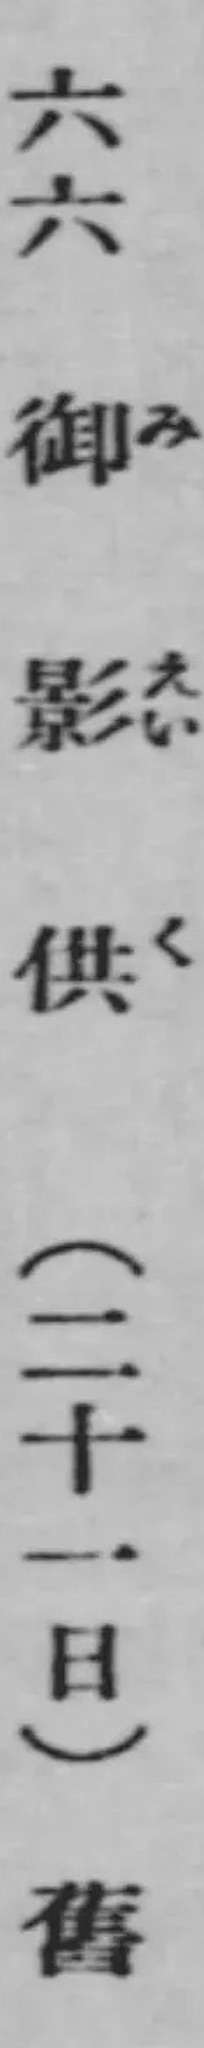六六御影供(二十一日)舊
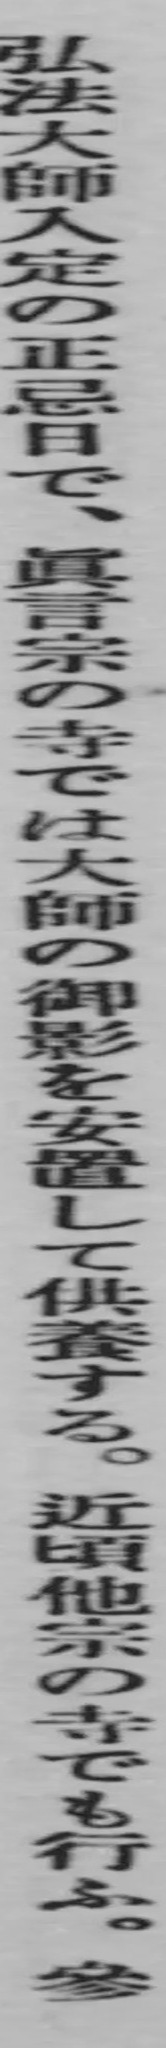弘法大師入定の正忌日で、眞言宗の寺では大師の御影を安置して供養する。近頃他宗の寺でも行ふ。參
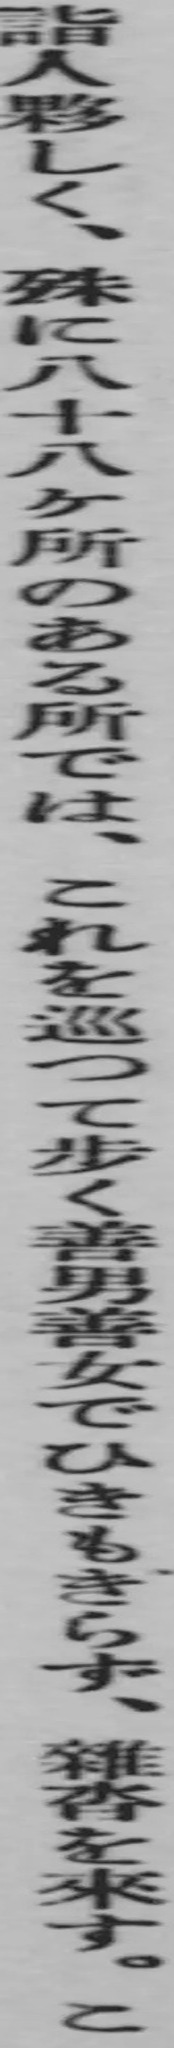詣人夥しく、殊に八十八ヶ所のある所では、これを巡つて歩く善男善女でひきもきらず、雜沓を來す。こ
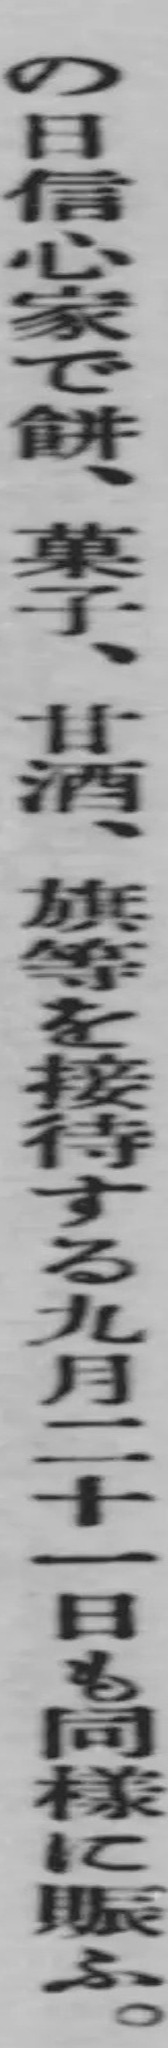の日信心家で餅、菓子、甘酒、旗等を接待する九月二十一日も同様に賑ふ。
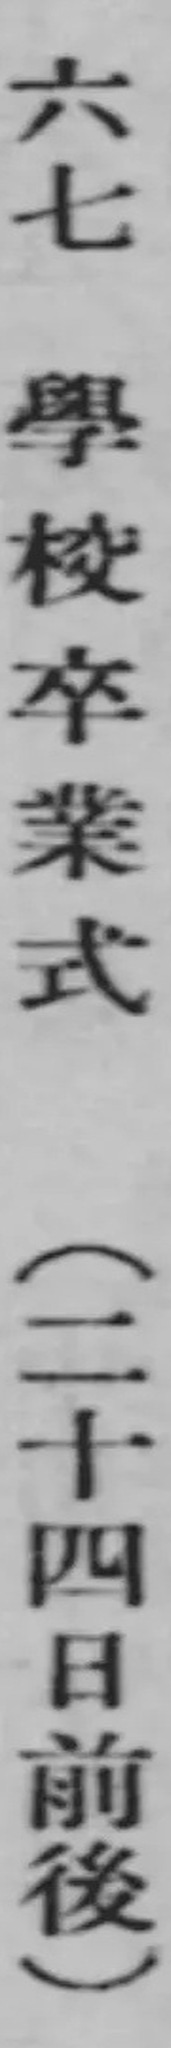六七學校卒業式(二十四日前後)
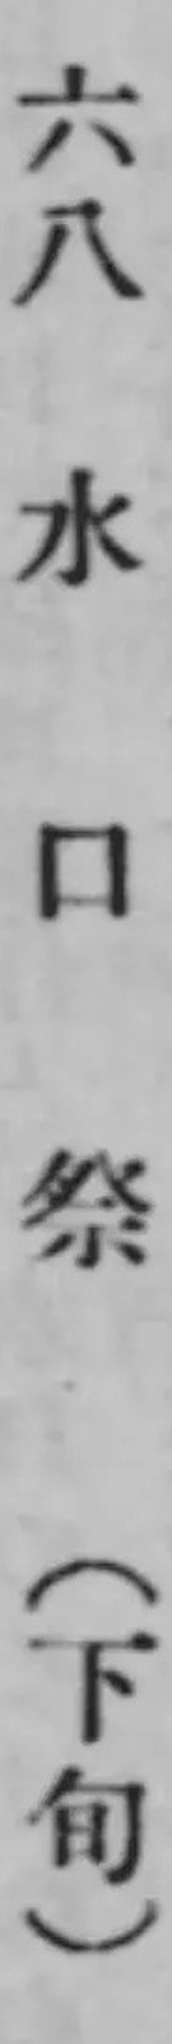六八水口祭(下旬)
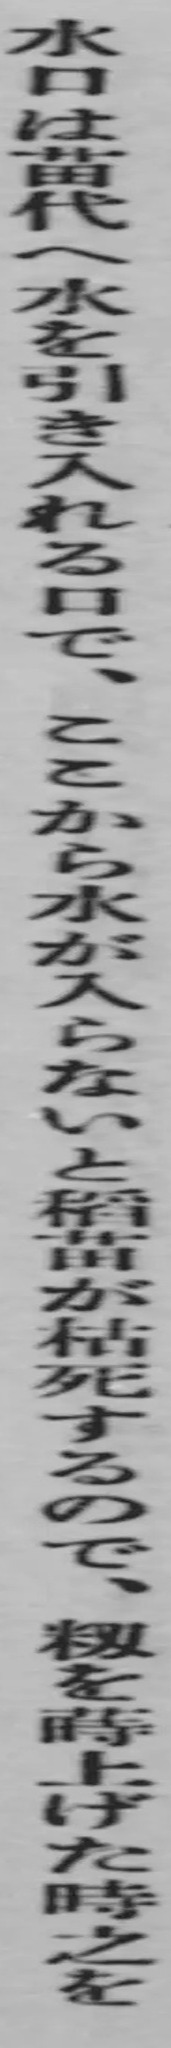水口は苗代へ水を引き入れる口で、ここから水が入らないと稻苗が枯死するので、籾を蒔上げた時之を
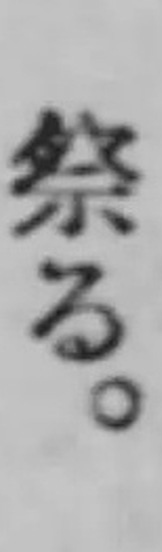祭る。

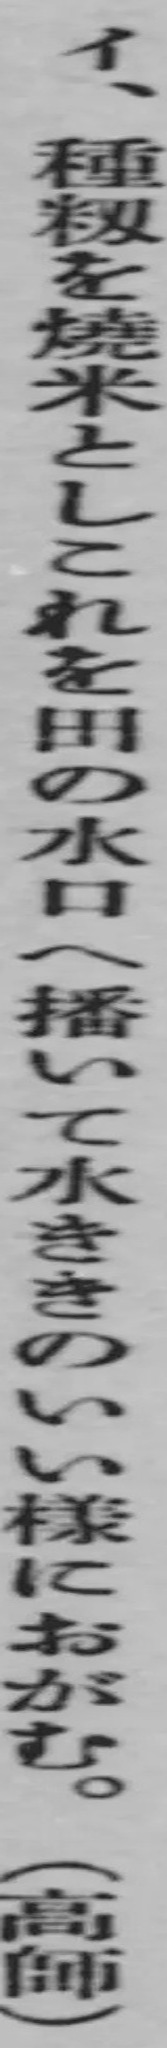イ、種籾を燒米としこれを田の水口へ播いて水ききのいい様におがむ。(高師)
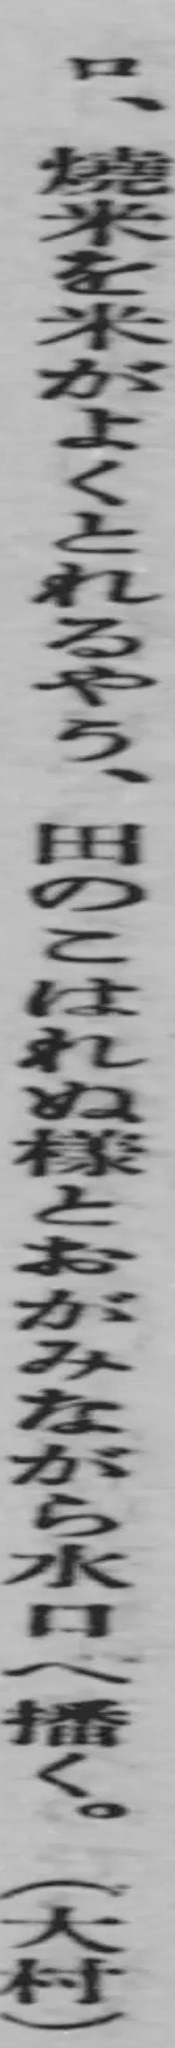ロ、燒米を米がよくとれるやう、田のこはれぬ様とおがみながら水口へ播く。(大村)
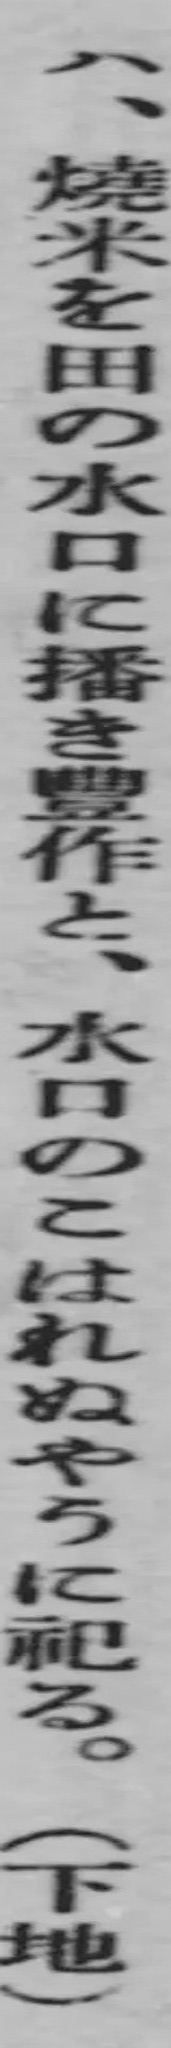ハ、燒米を田の水口に播き豐作と、水口のこはれぬやうに祀る。(下地)
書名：豊橋の年中行事
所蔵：国立国会図書館 National Diet Library, JAPAN
